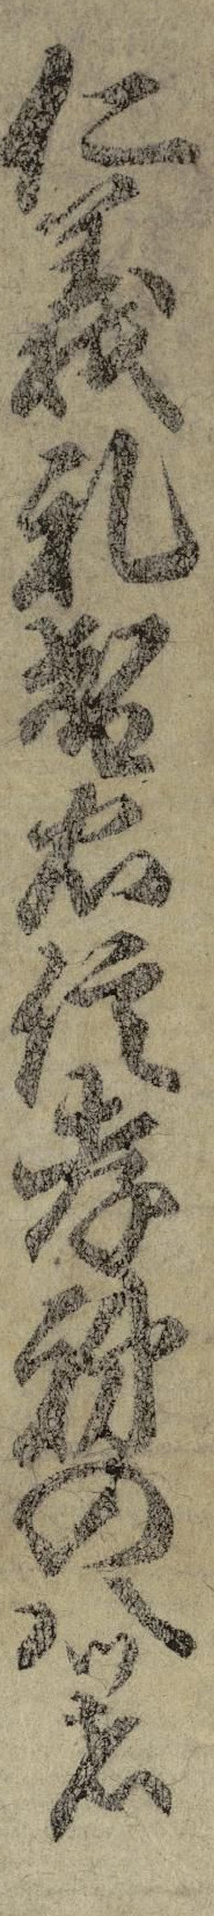仁義礼智忠信孝悌の八ツは
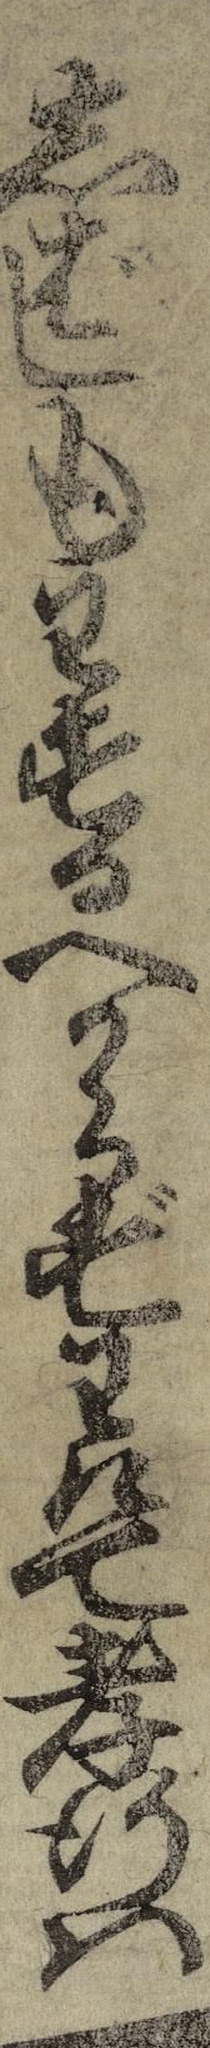しばしもわするへからずわけて孝行は
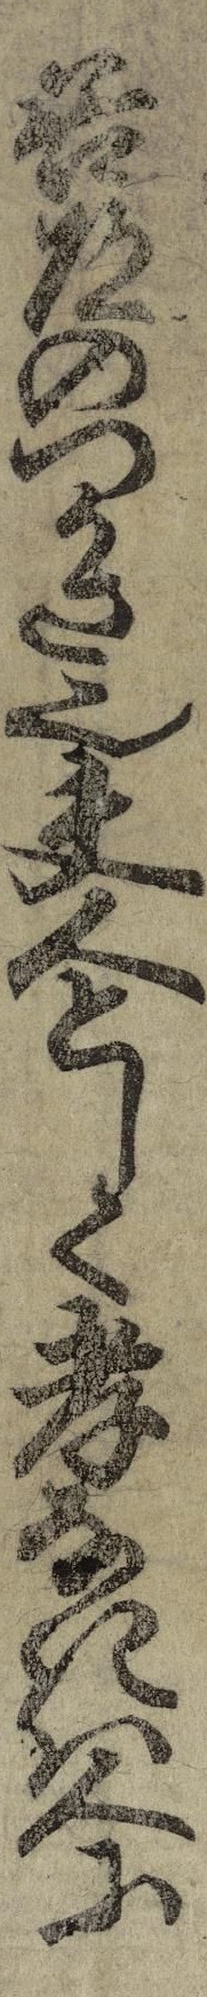善道のつかさ也夫人として孝なきは人に
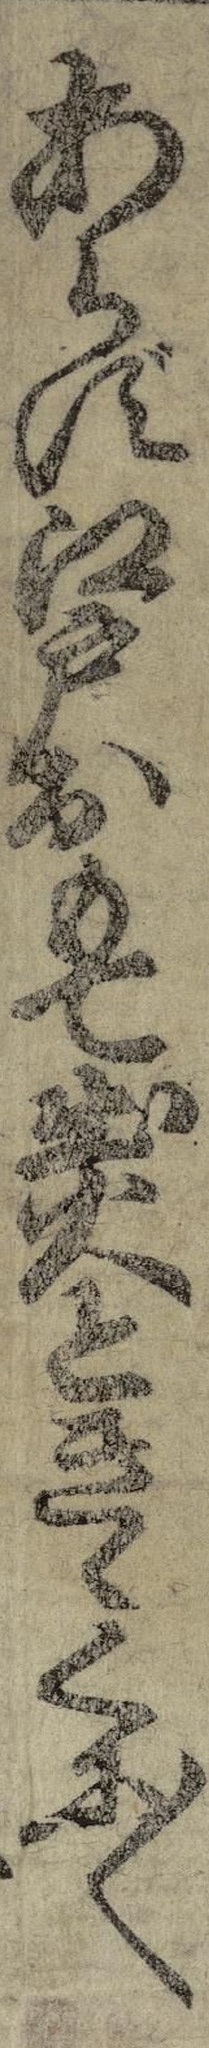あらず江戸おもて出火ときゝくに〳〵
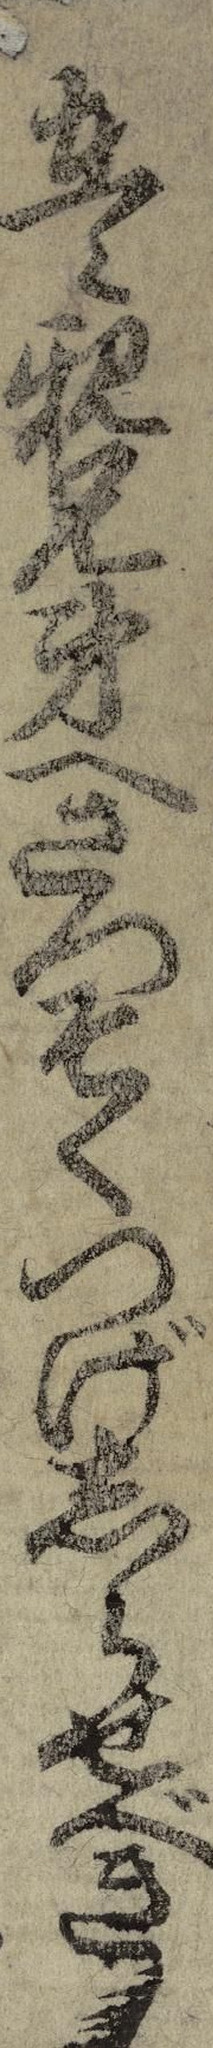互に親兄弟へさつそくつげしらせべき
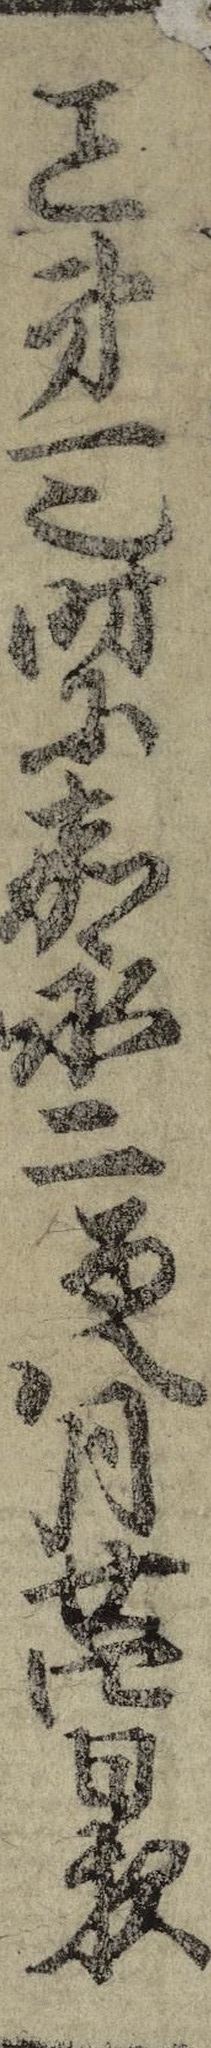こと第一也時に嘉永二酉八月廿四日夜
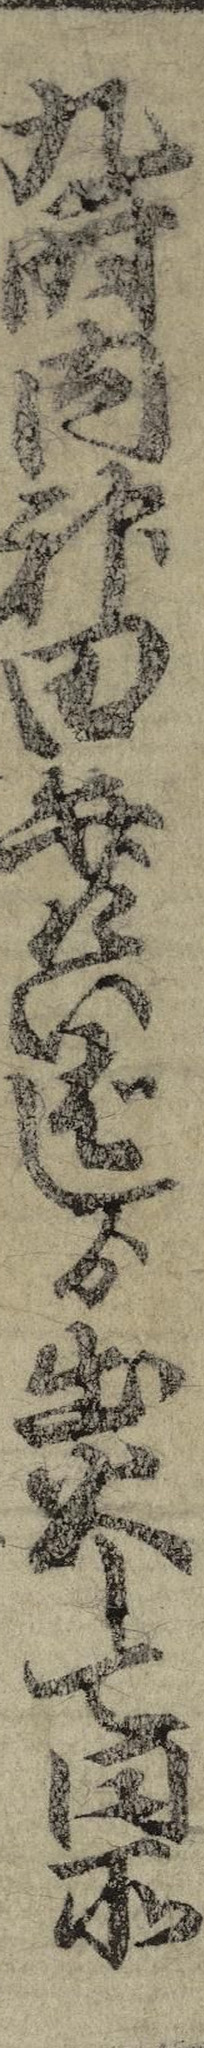九時内神田弁けいばしゟ出火して同所
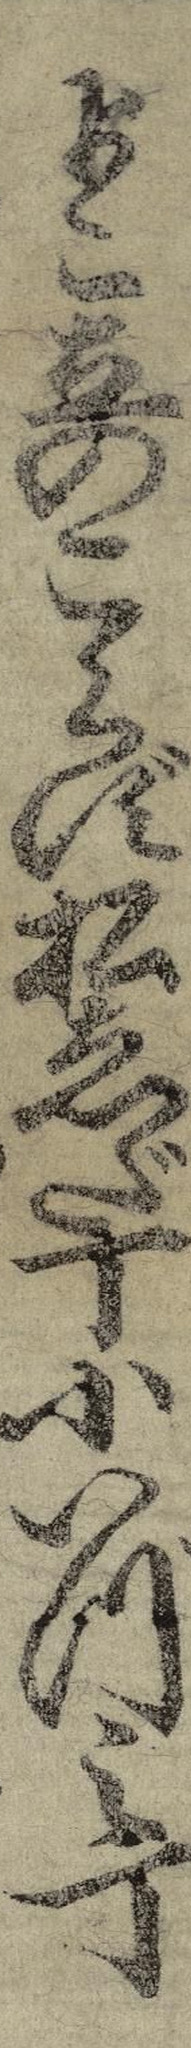よこ立のこらず松ゑだ丁小いづミ丁
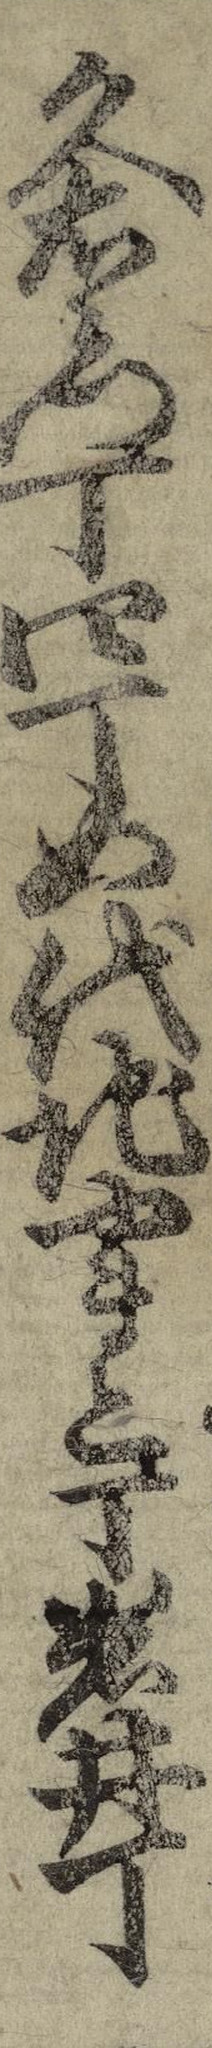久右衛門丁四丁め代地やまと丁岩井丁
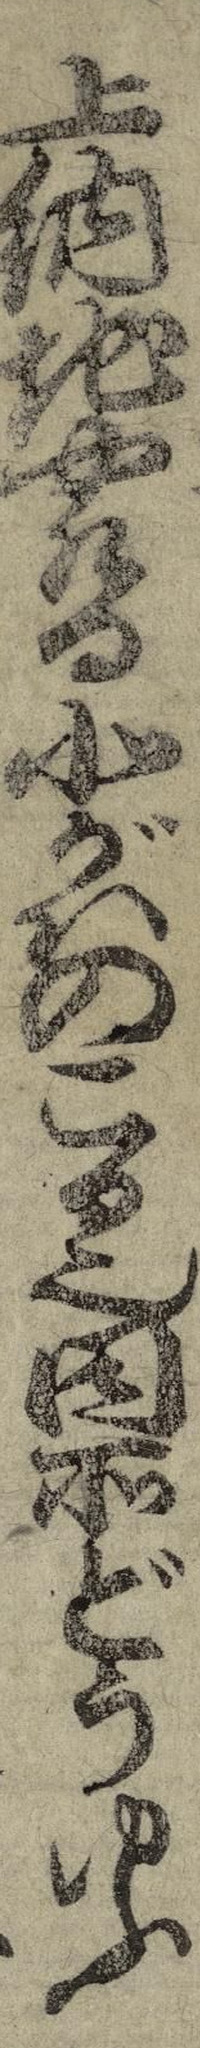上納地やける北がはのこる也同所どうゆふ
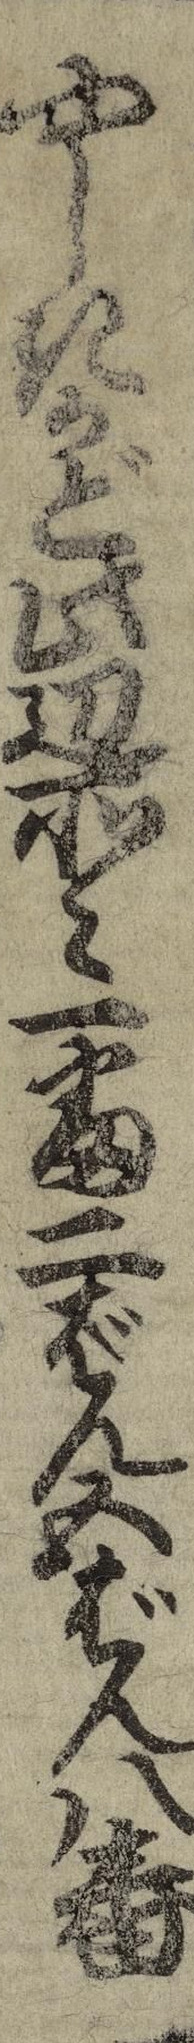やしきかど此辺所〻一番二ばん五ばん八番
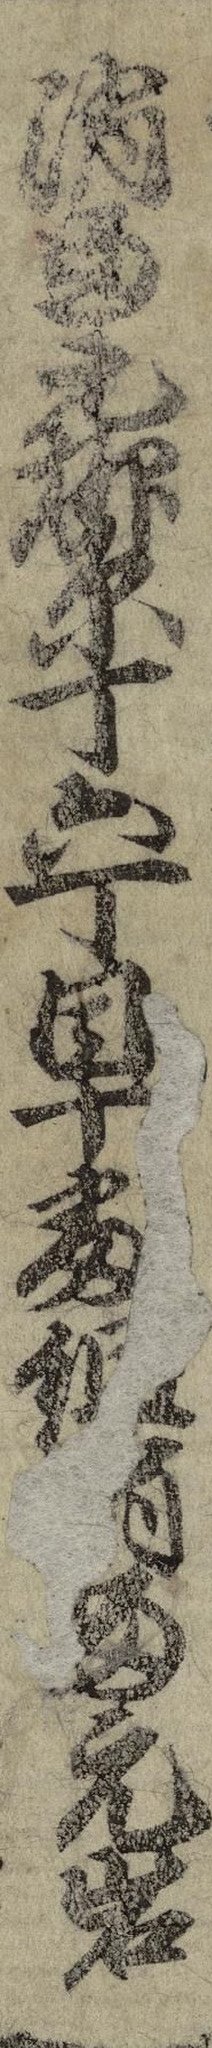消留元柳原丁六丁目十番組消留元岩
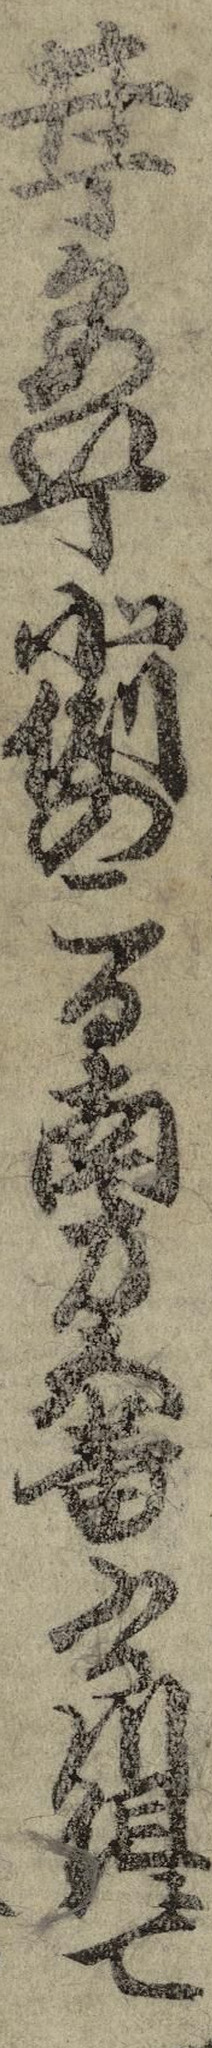井丁かめい丁北側のこる南方五番ふる川組にて
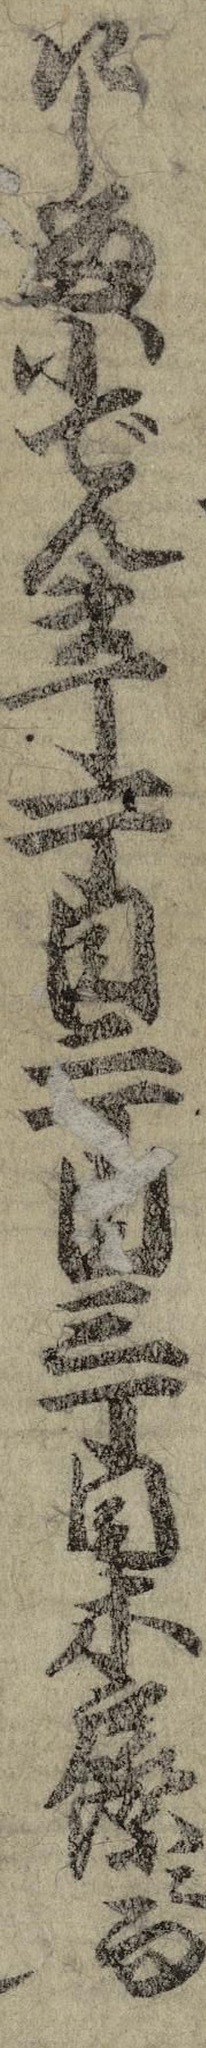けし留小でんま丁一丁目二丁目三丁目木戸際に而
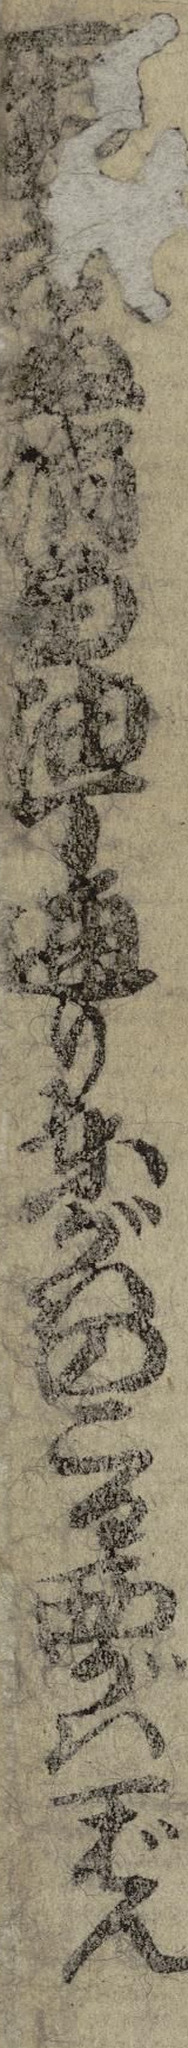消留油丁通り東がはのこる西がは一ばん
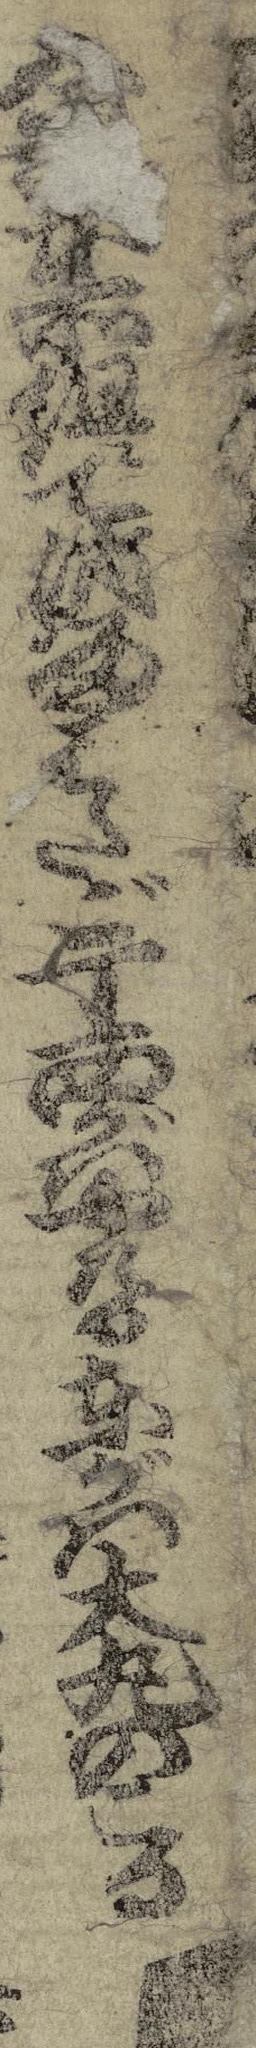所組にて消留はたご丁西がはやける東がは大丸のこる
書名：焼場獨案内
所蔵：東京大学地震研究所図書室 Earthquake Research Institute Library, The University of Tokyo, JAPAN
